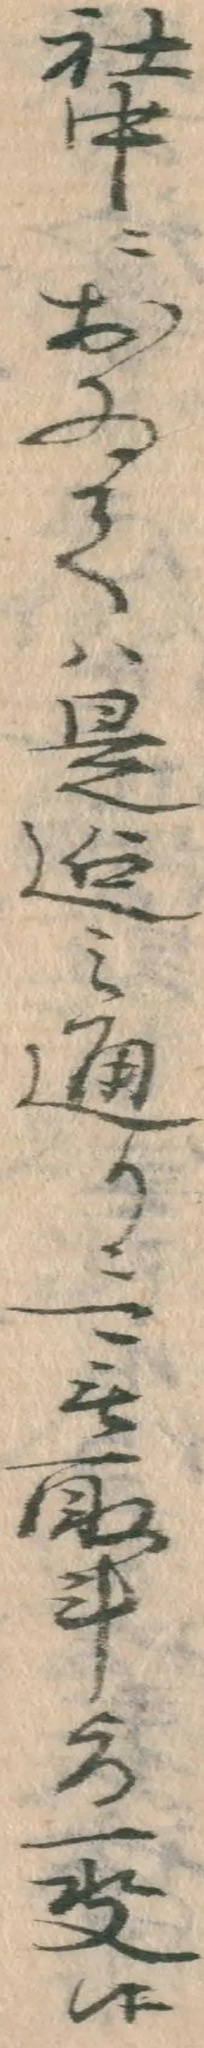社中ニおゐてハ是延之通りニ可被取計旨一決候
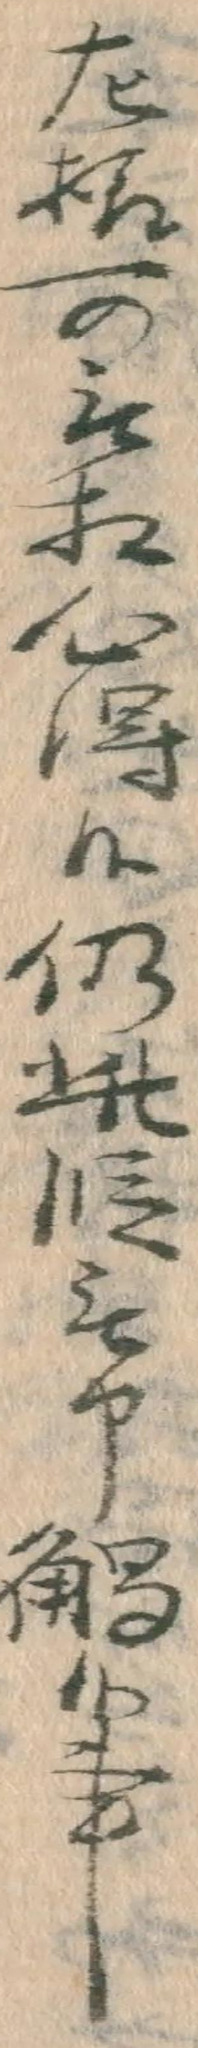左様可被相心得候仍此段被申触候事
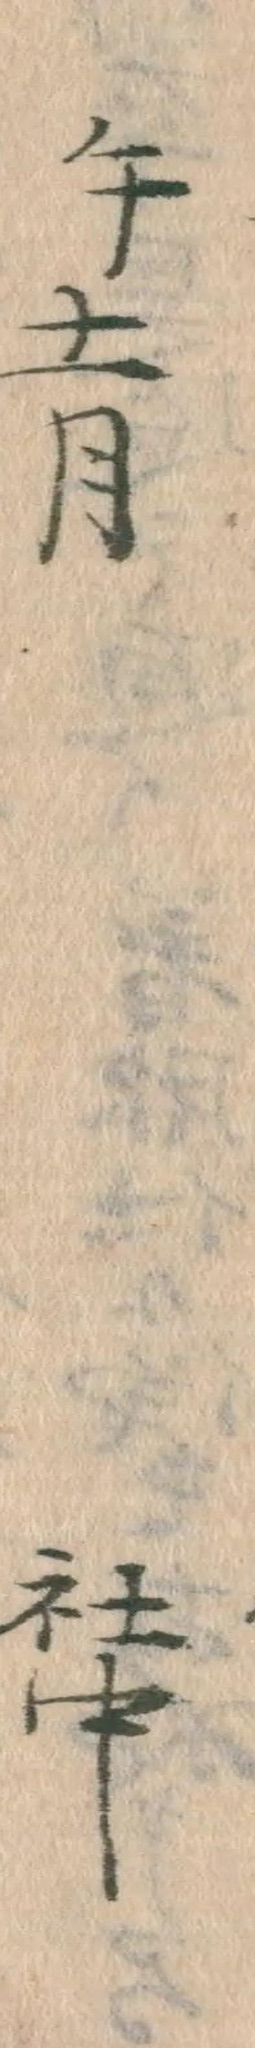午十一月社中
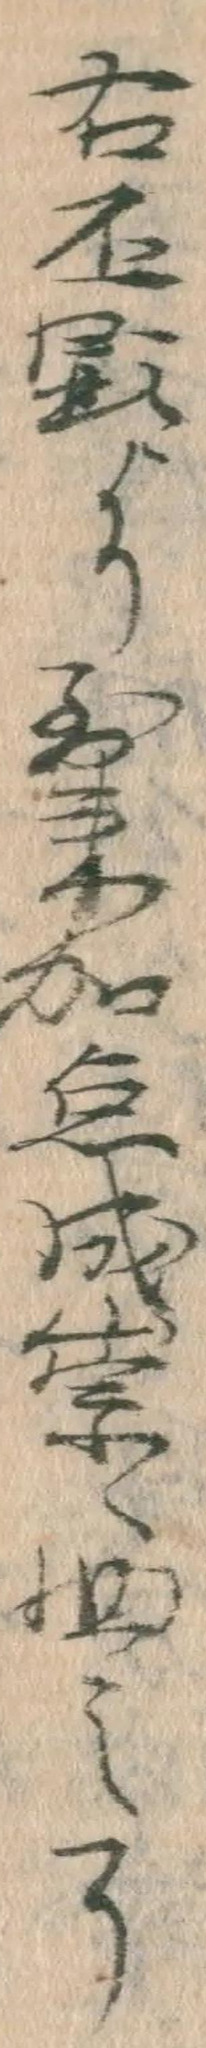右丕顕より到来加点成祟へ回之了
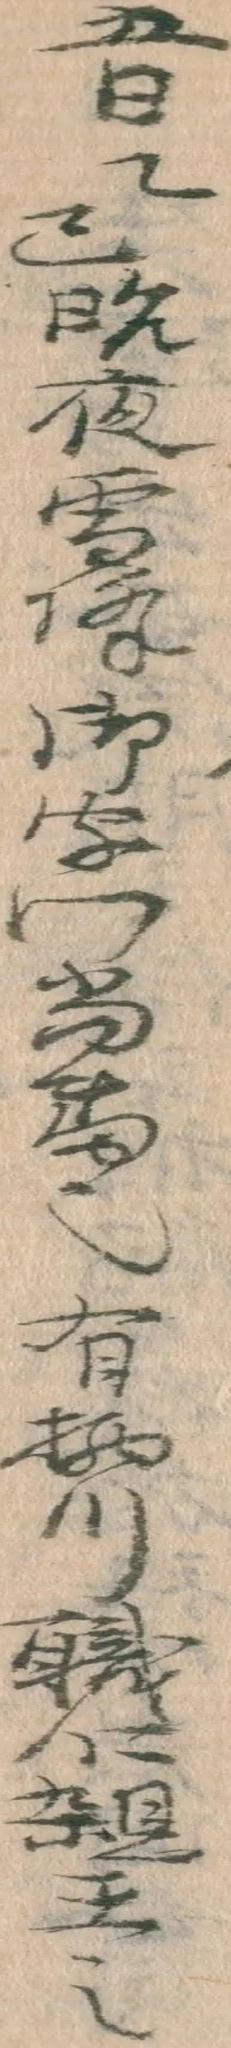五日乙巳晩夜雪降御家門當番也有栖川職仁親王之
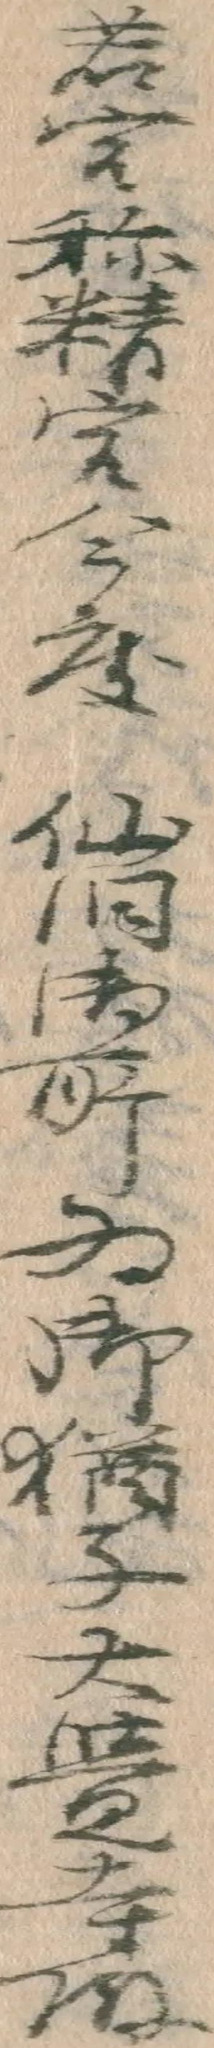若宮称精宮今度仙洞御所為御猶子大覚寺殿
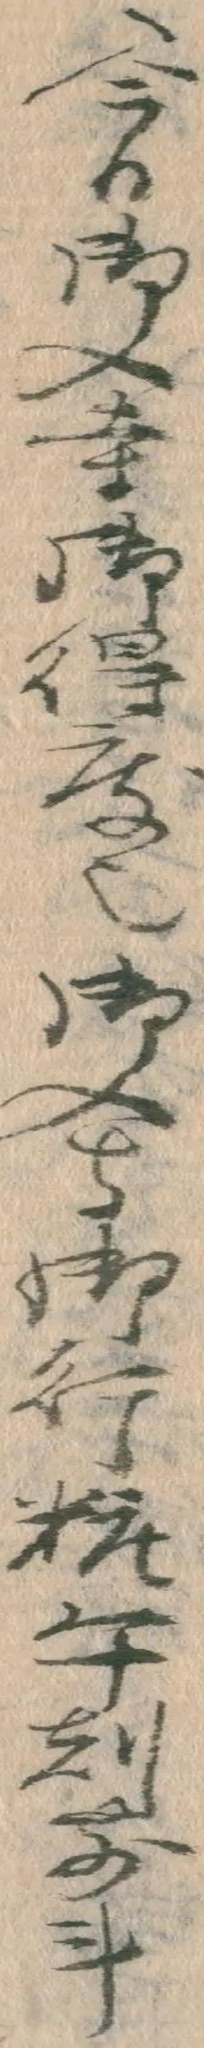ヘ今日御入寺御得度也御入守御行粧午刻前斗
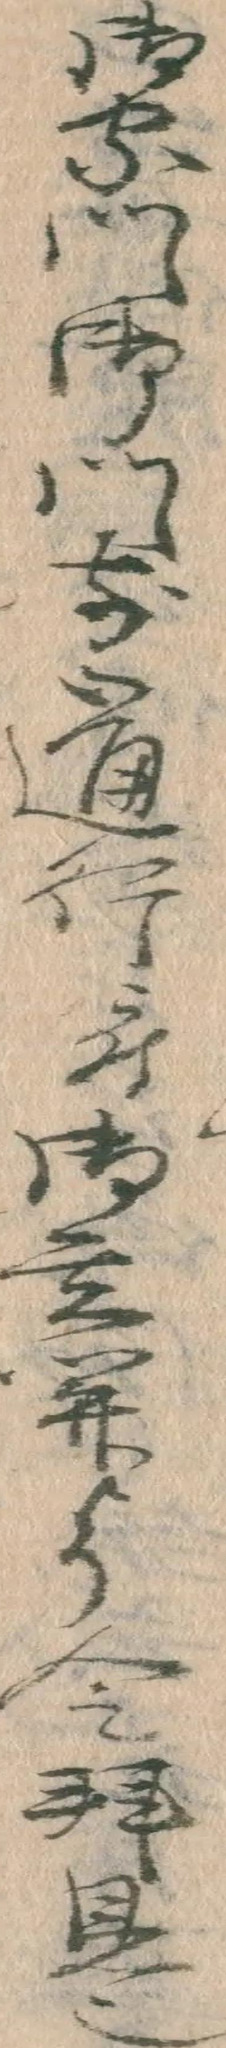御家門御門前御通行ニ付御玄関より令拝見也
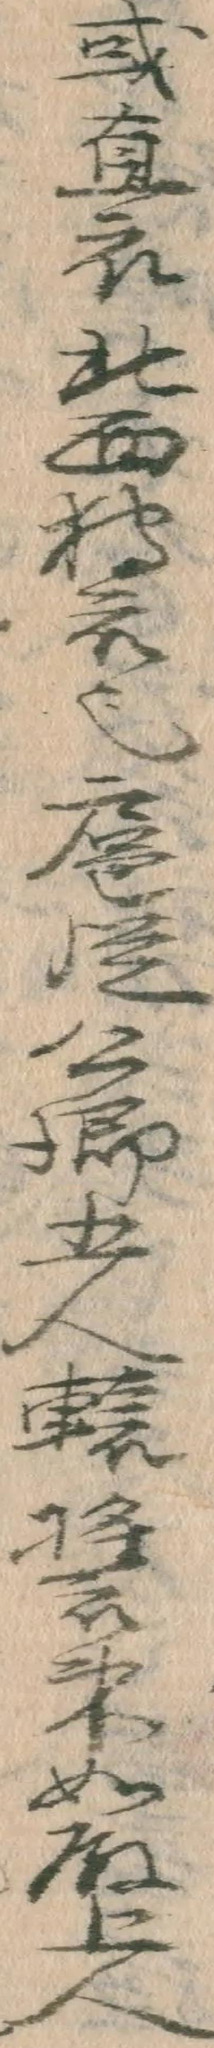或直衣北面狩衣也扈従公卿五人轅装束如殿上人
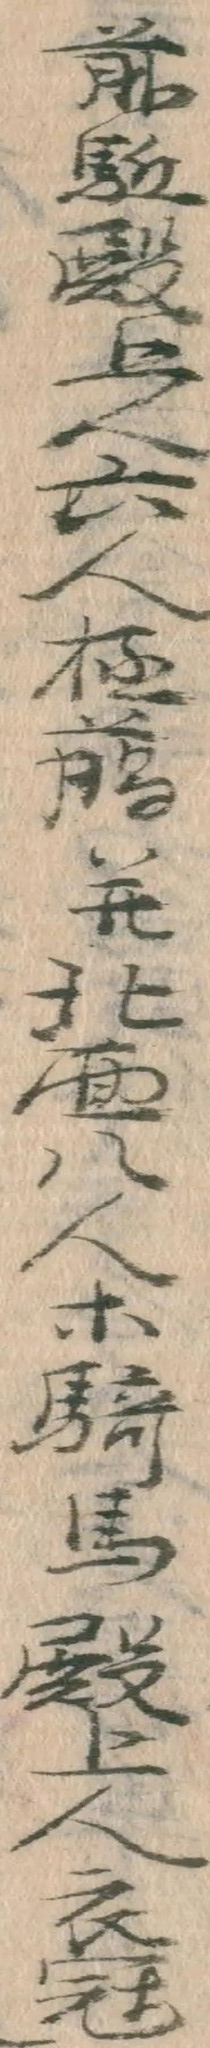前駈殿上人六人極臈并北面八人等騎馬殿上人衣冠
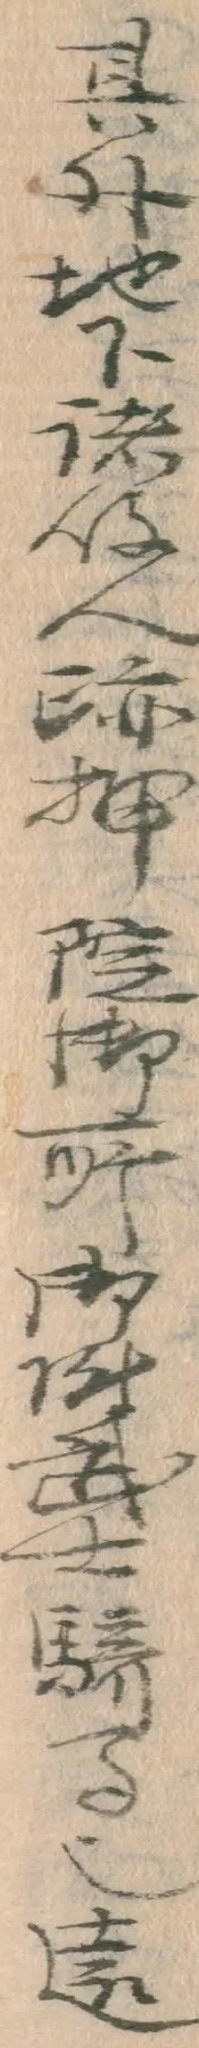其外地下諸役人跡押御所御附武士騎馬也遠
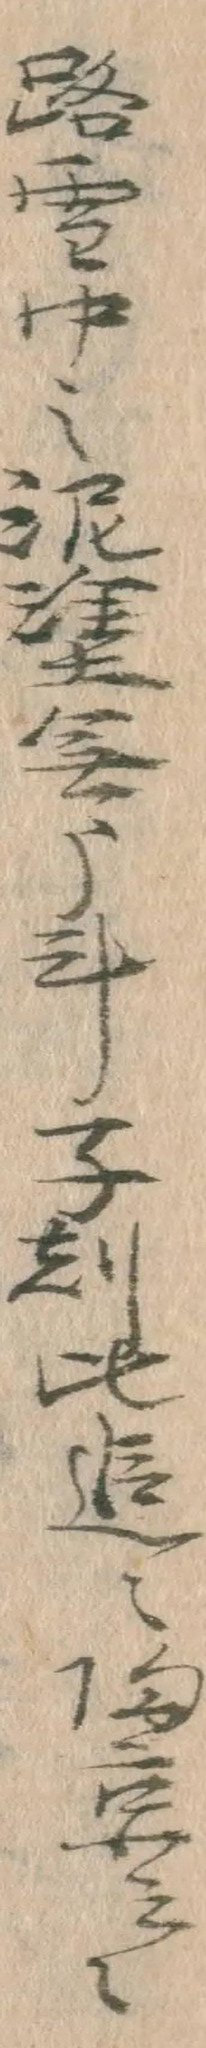路雪中之泥塗無申斗子刻此追々帰宮云々
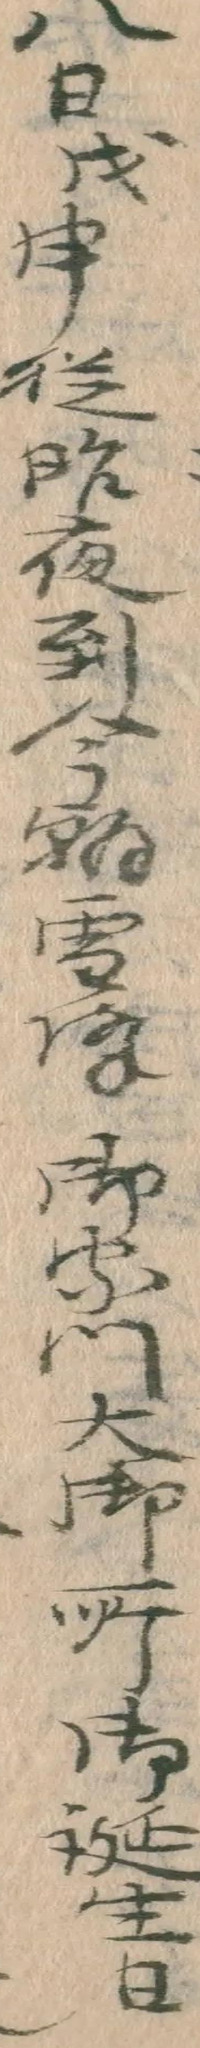八日戊申従昨夜到今朝雪降御家門大御所御誕生日
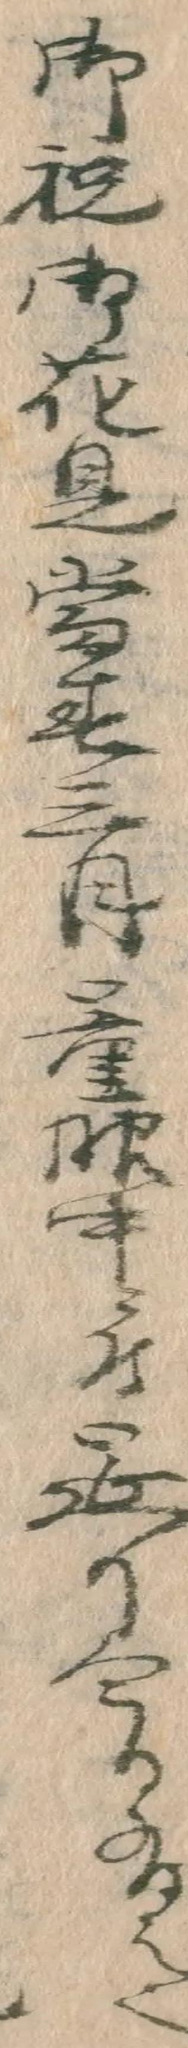御祝御花見當春三月御重服中ニ付御延引今日有之
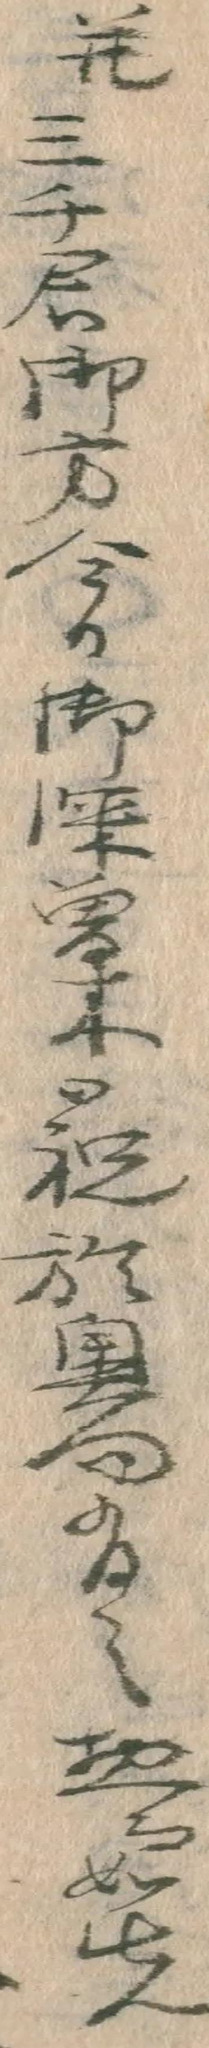并三千君御方今日御深曽木御祝於奥向有之惣而如先
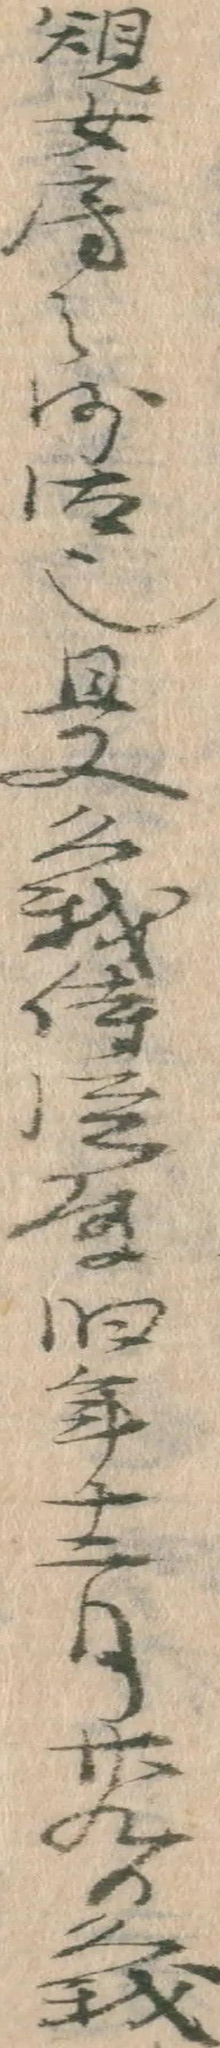規女房之沙汰也且又久我侍従殿旧年十二月廿九日久我
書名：賀茂社記録. 第63冊
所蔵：国立国会図書館 National Diet Library, JAPAN
